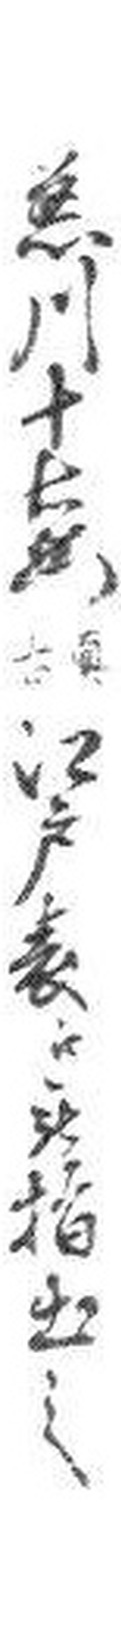荒川十右衛門貞江戸表江被指出之
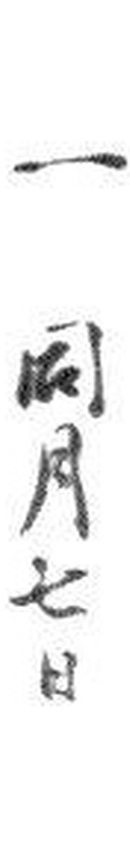一同月七日
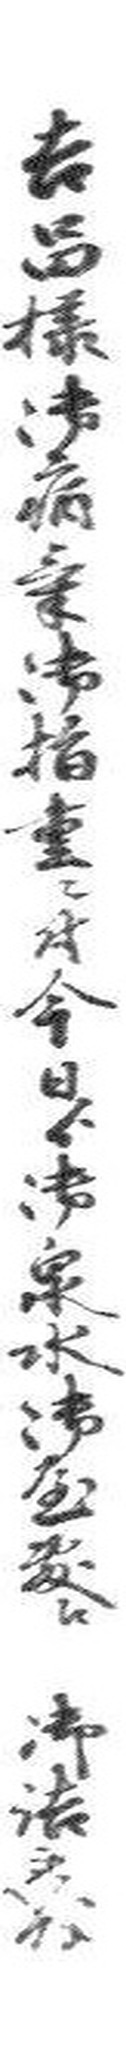吉品様御病気御指重ニ付今日ゟ御泉水御屋敷江御詰被成
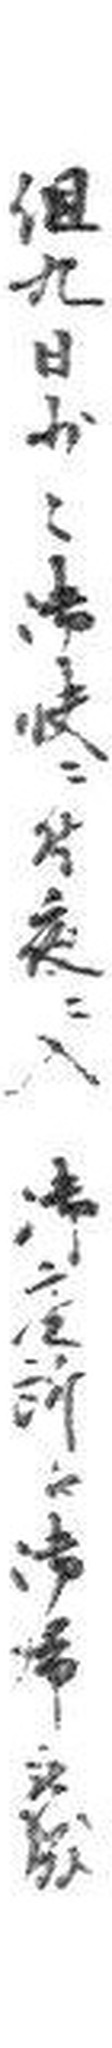但九日少々御快ニ付夜ニ入御座所江御帰被成
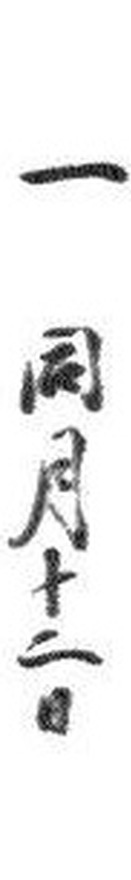一同月十二日
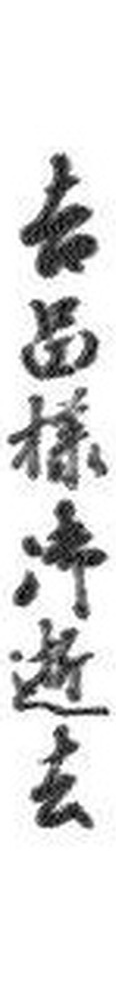吉品様御逝去
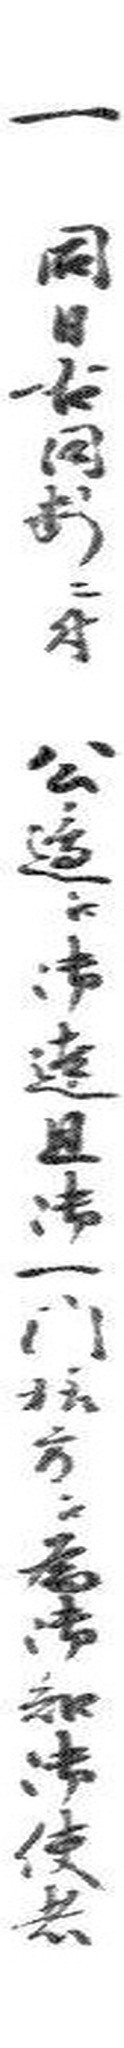一同日右同断ニ付公辺江御達且御一門様方江為御知御使者
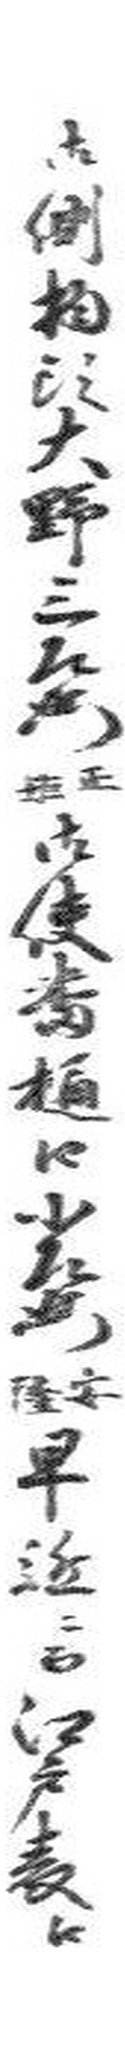御側物頭大野三左衛門正御使番樋口小左衛門安隆早駈ニ而江戸表江
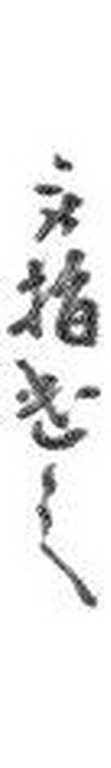被指遣之
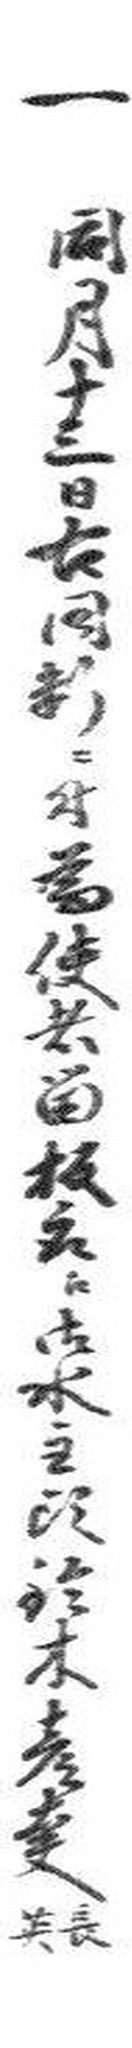一同月十三日右同断ニ付為御使者留板取江御水主頭鈴木彦太夫長英
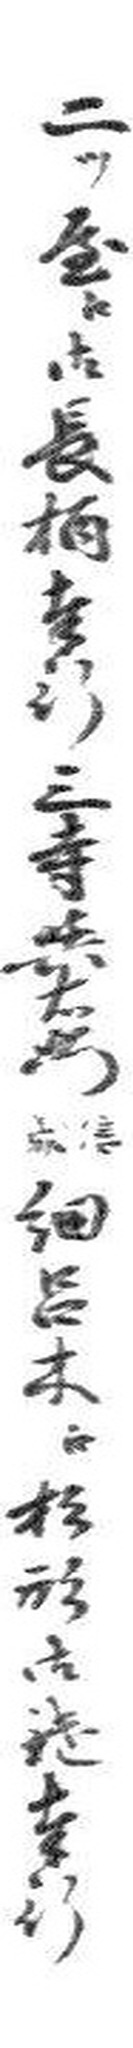二ツ屋江御長柄奉行三寺与右衛門信細呂木江杉形御鑓奉行

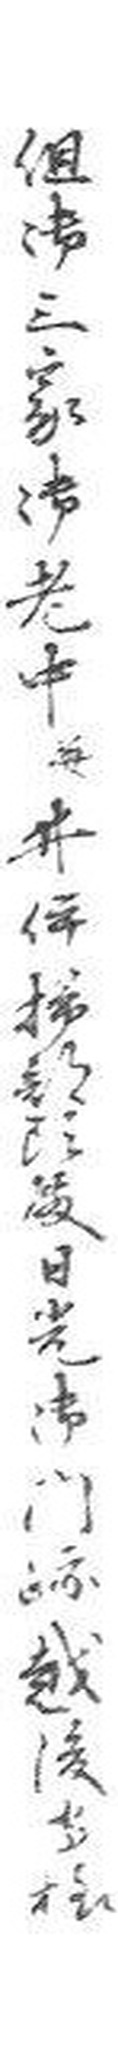但御三家御老中并井伊掃部守殿日光御門跡越後守様
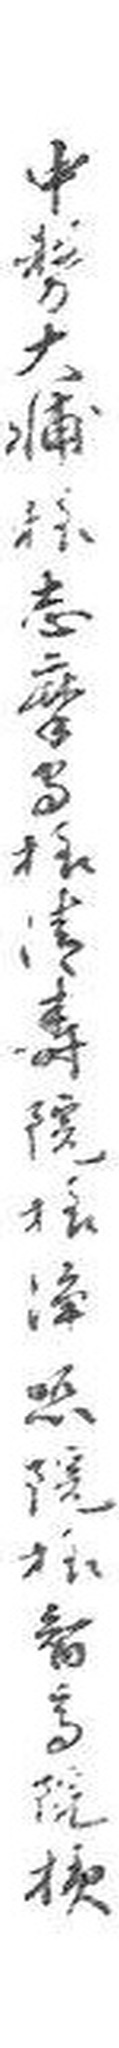中務大輔様志摩守様清壽院様浄照院様智高院様
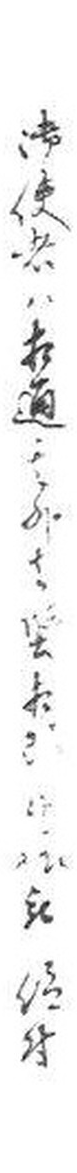御使者ハ相通其外者堅相断候様被仰付
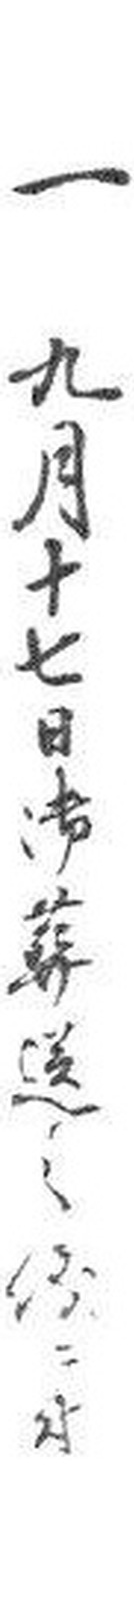一九月十七日御葬送之儀ニ付
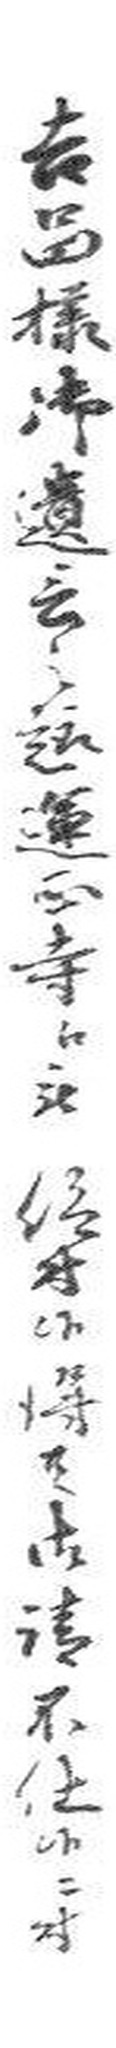吉品様御遺言之趣運正寺江被仰付候得共御請不仕候ニ付
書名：家譜 二十八 吉邦公 従宝永七年七月五日到正徳元年十二月
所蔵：福井県文書館 Fukui Prefectural Archives
